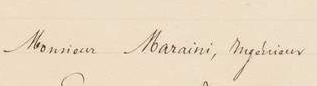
Monsieur Maraini, Ingénieur
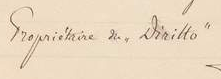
Propriétaire du «Diritto»
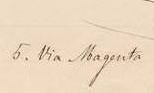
5. Via Magenta
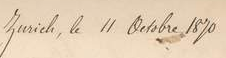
Zurich, le 11 Octobre 1870
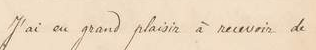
J´ai eu grand plaisir à recevoir de
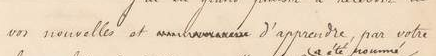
vos nouvelles et ... d´apprendre, par votre
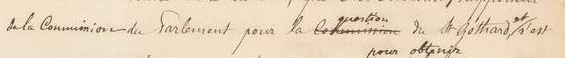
de la Commission du Parlament pour la Commissionquestion du St. Gothard, et s´est
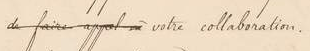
de faire appel à votre collaboration.
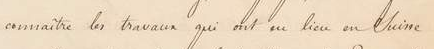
connaître les travaux qui ont eu lieu en Suisse
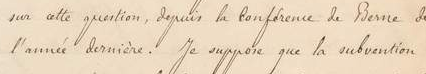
l´année dernière. Je suppose que la subvention
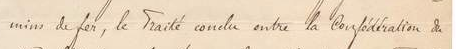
mins de fer, le Traité conclu entre la Confédération du
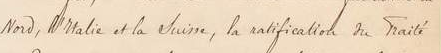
Nord, l´Italie et la Suisse, la ratification du Traité
